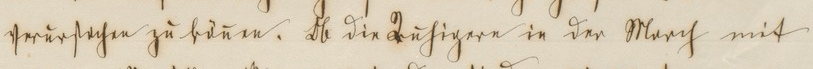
verursachen zu können. Ob die Ruhigern in der March mit
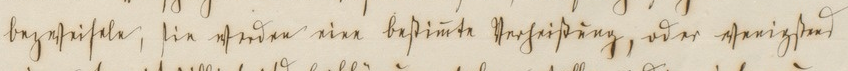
bezweifeln, sie werden eine bestimmte Verheißung, oder wenigstens
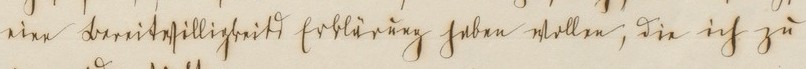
eine Bereitwilligkeits Erklärung haben wollen, die ich zu
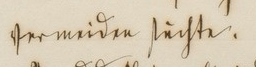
vermeiden suchte.
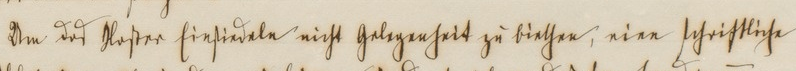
Um das Kloster Einsiedeln nicht Gelegenheit zu biethen, eine schriftliche
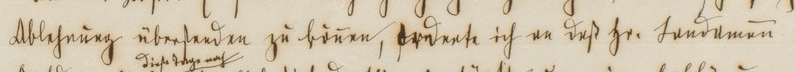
Ablehnung übersenden zu können, ordnete ich an daß Hr. Landamann
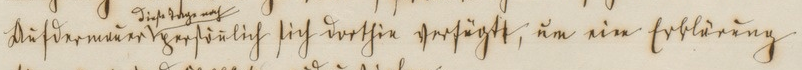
diese Tage noch persönlich sich dorthin verfügte, um eine Erklärung
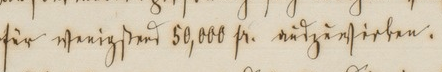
für wenigstens 50,000 fr. auszuwirken.
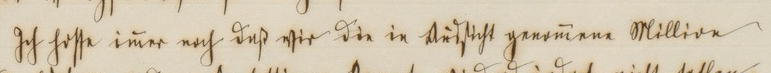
Ich hoffe immer noch daß wir die in Aussicht genommene Million
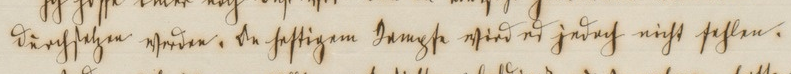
durchsetzen werden. An heftigem Kampfe wird es jedoch nicht fehlen.
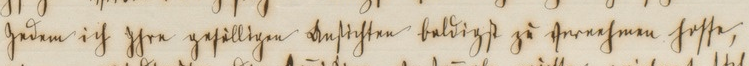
Indem ich Ihre gefälligen Ansichten baldigst zu vernehmen hoffe,
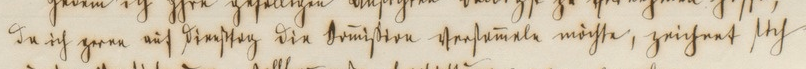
da ich gerne auf Dienstag die Kommission versammeln möchte, zeichnet sich
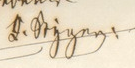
K. Styger.
